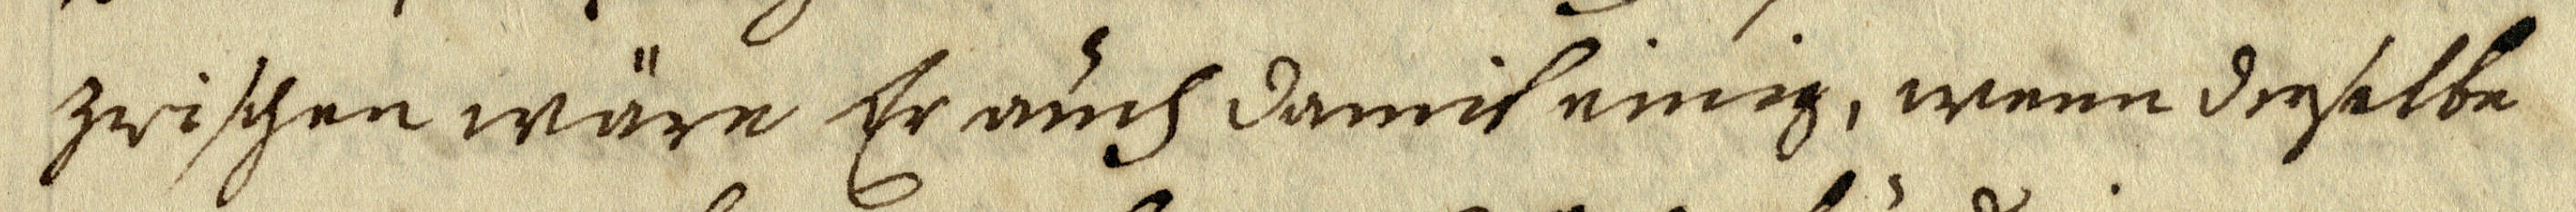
zwischen wäre Er auch damit einig, wenn derselbe
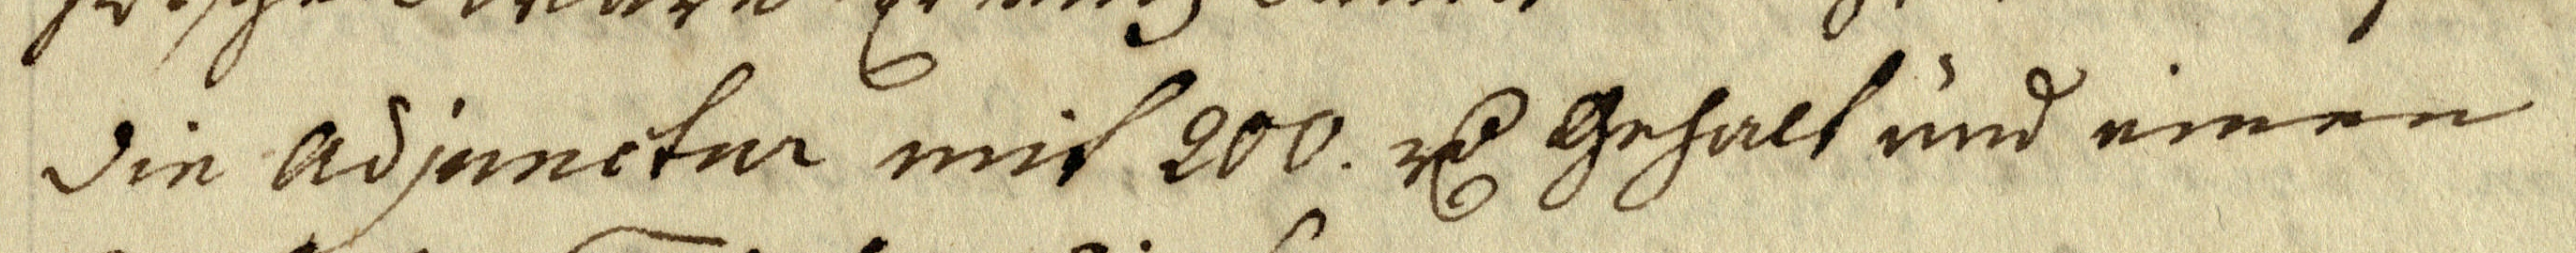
die Adjunctur mit 200 rl. Gehalt und einen
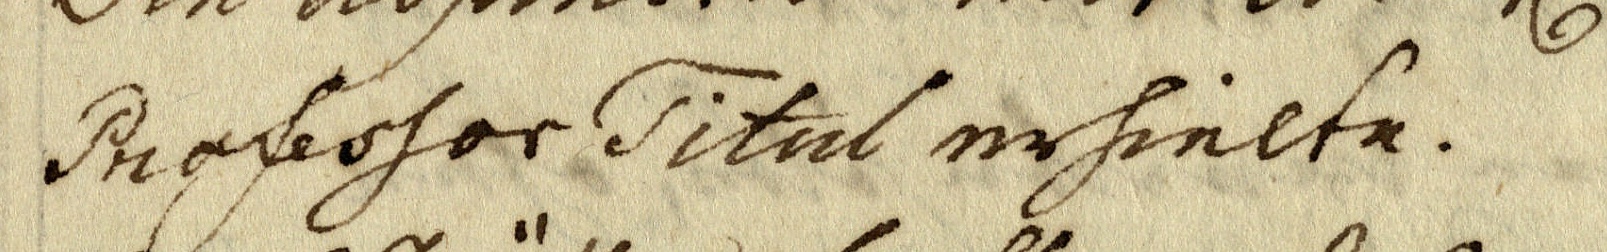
Professor Titul erhielte.
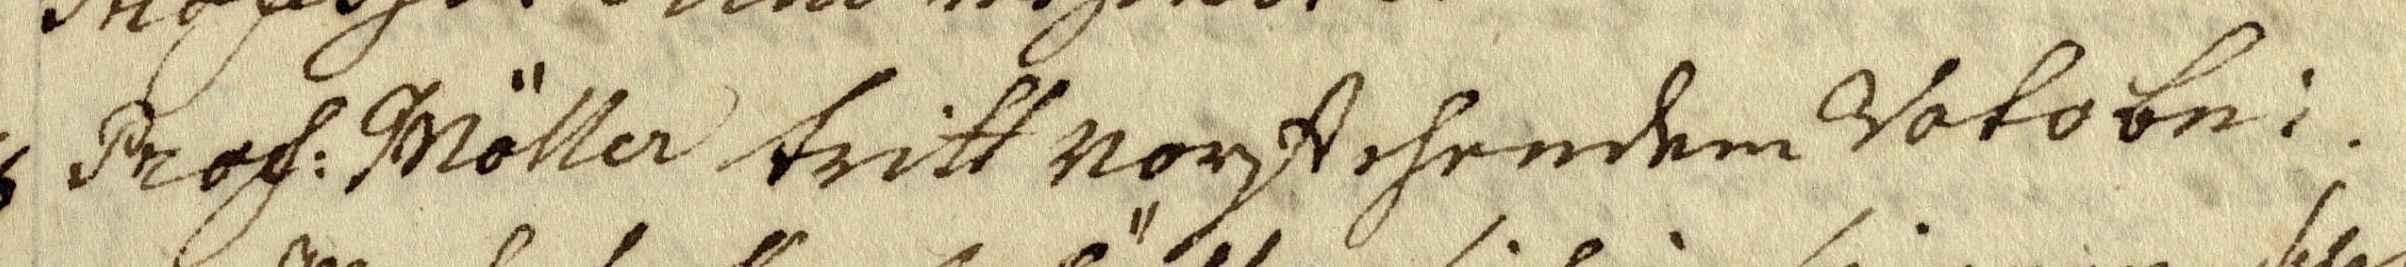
dh Prof. Möller tritt vorstehendem Voto bei.
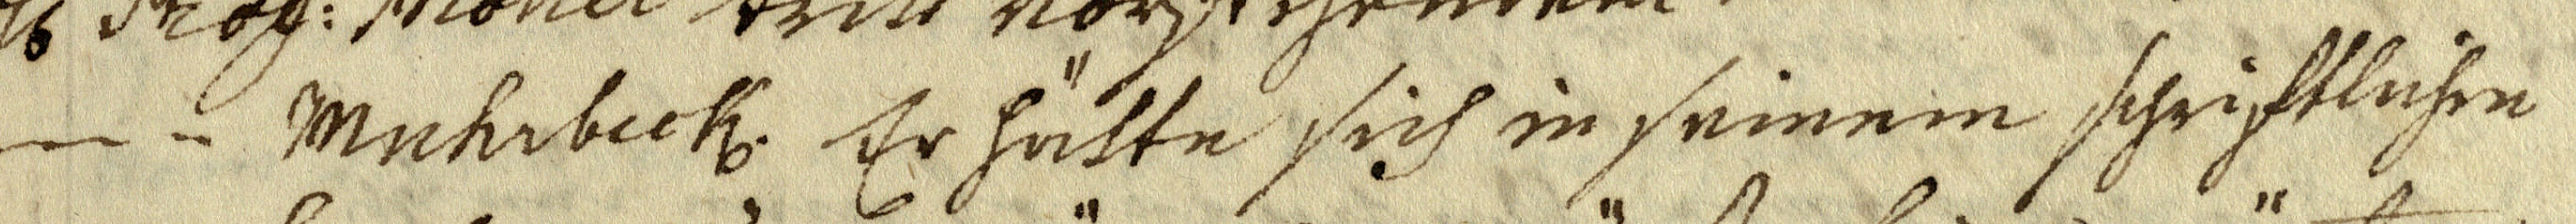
Muhrbeck. Er hätte sich in seinem schriftlichen
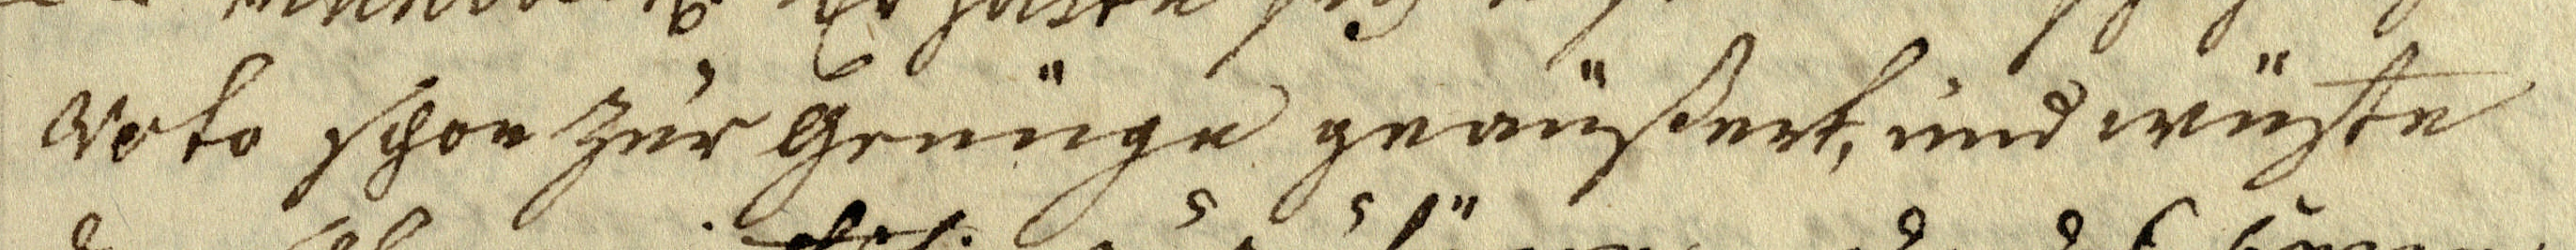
voto schon zur Genüge geäußert, und wüste
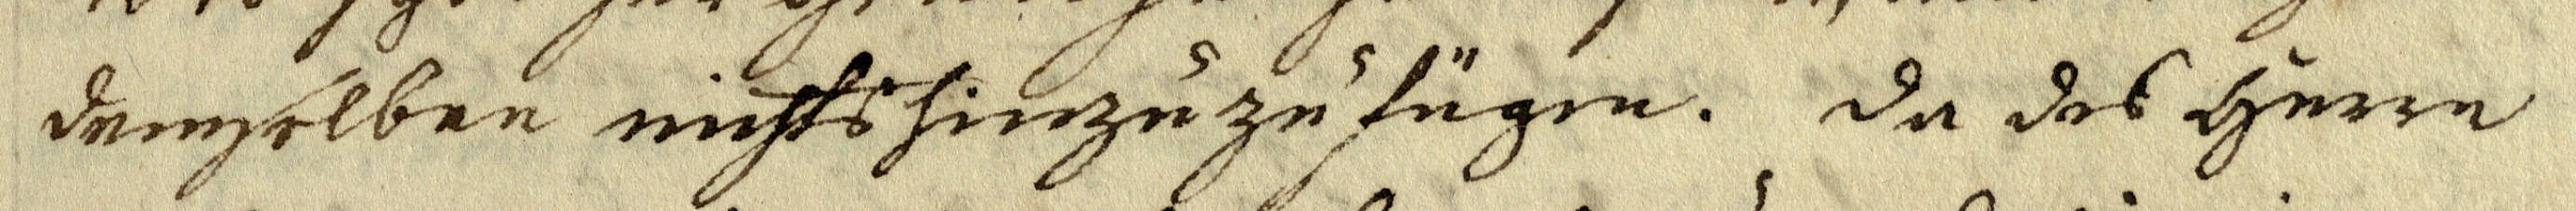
demselben nichts hinzu zu fügen. Da des Herrn
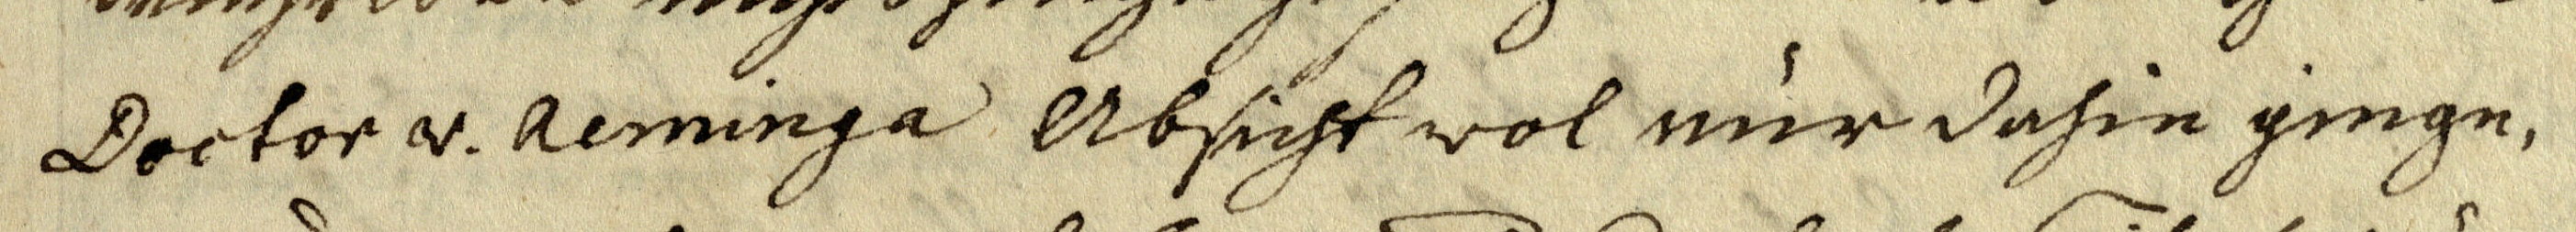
Doctor v. Aeminga Absicht nur dahin ginge,
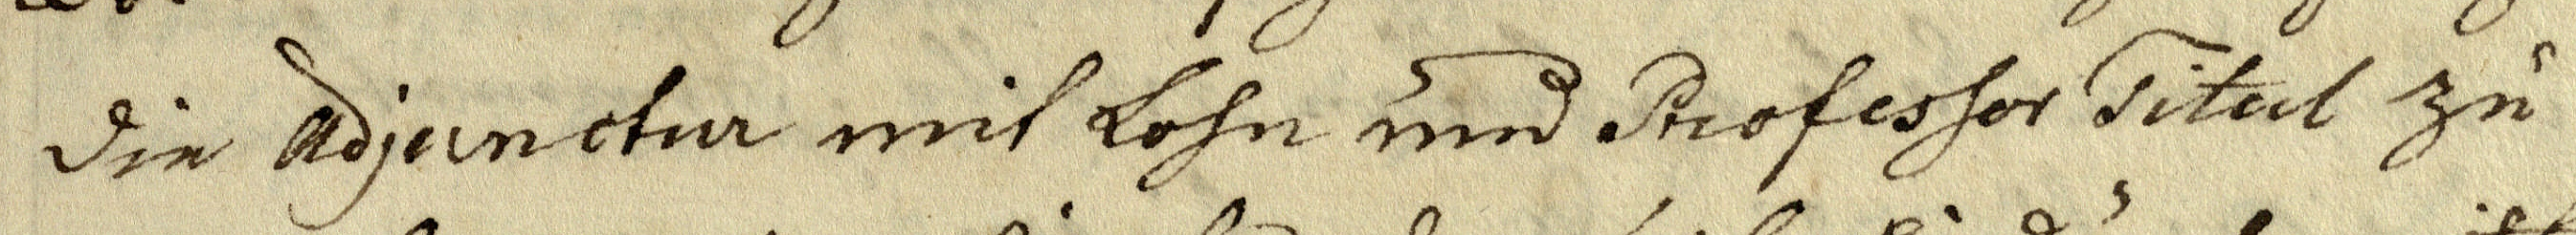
die Adjunctur mit Lohn und Professor Titul zu
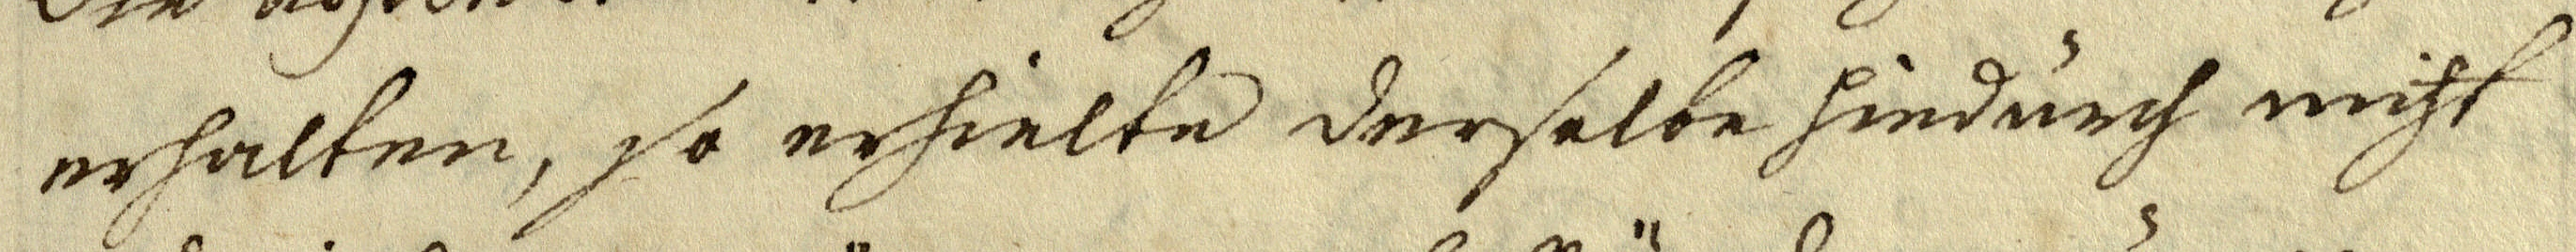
erhalten, so erhielte derselbe hiedurch nicht
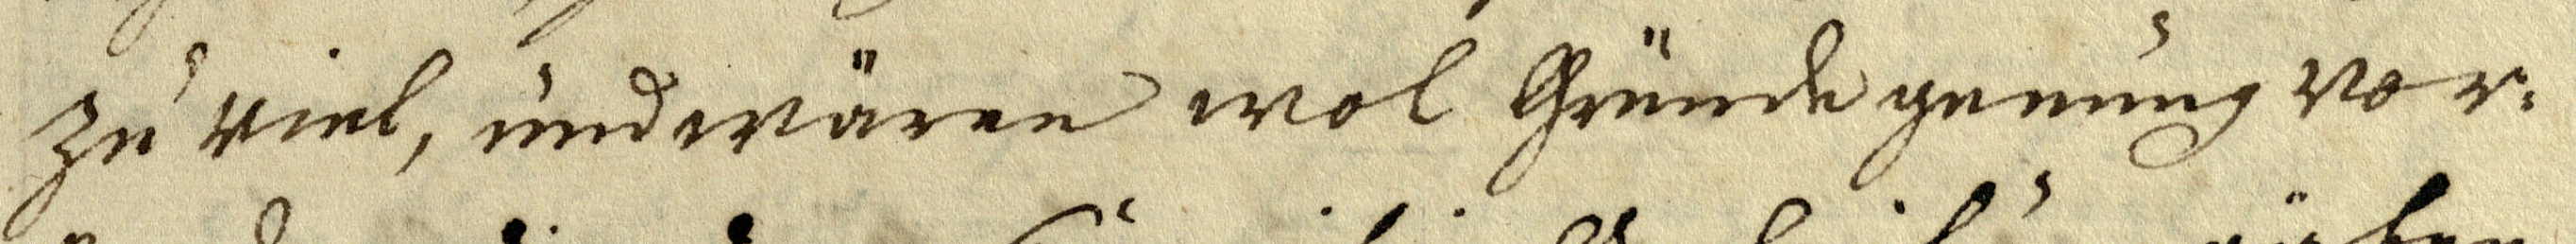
zu viel, und wären wol Gründe genug vor¬
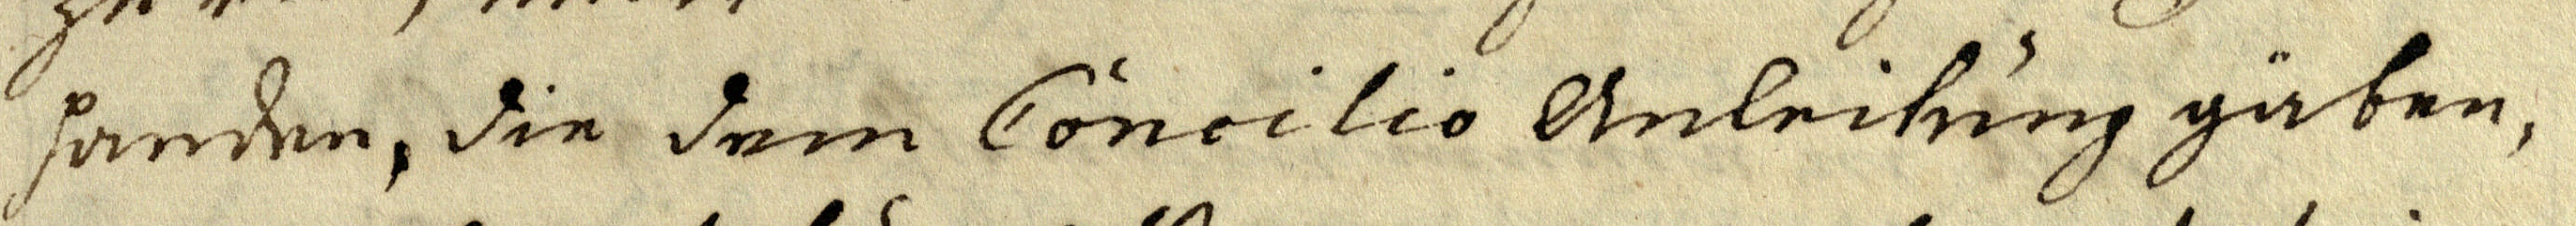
handen, die dem Concilio Anleitung gäben,
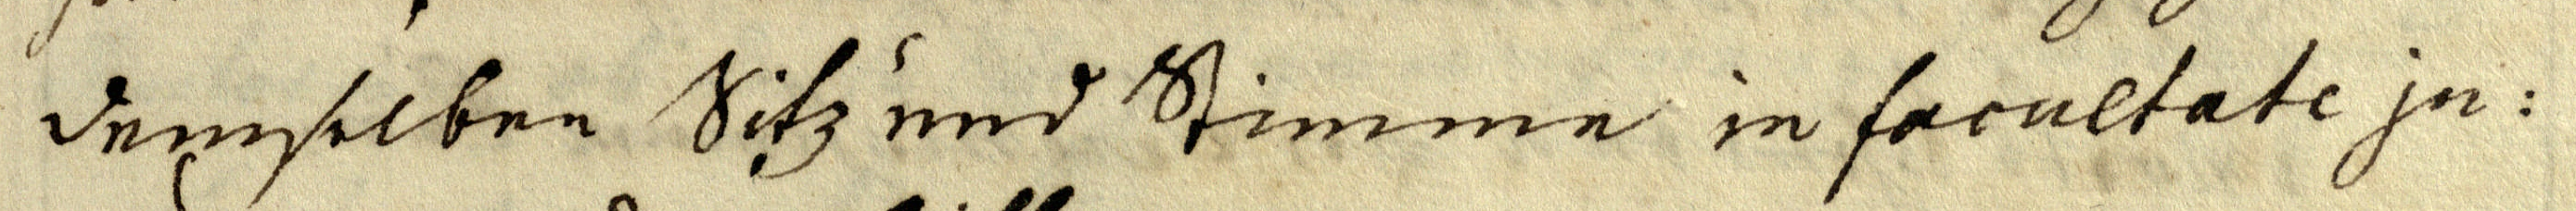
demselben Sitz und Stimme in facultate ju¬
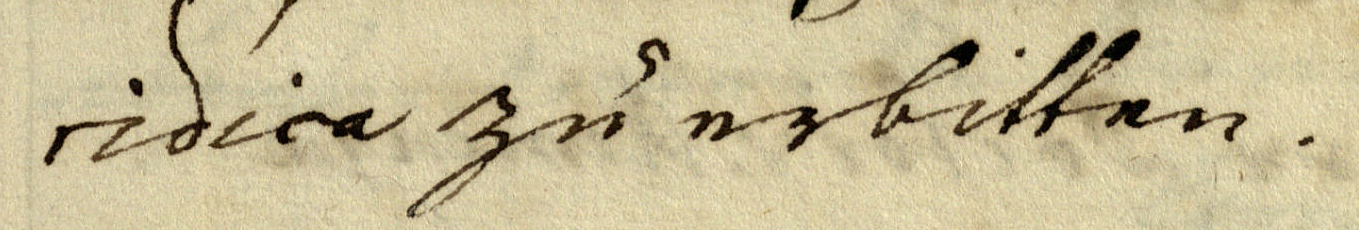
ridica zu erbitten.
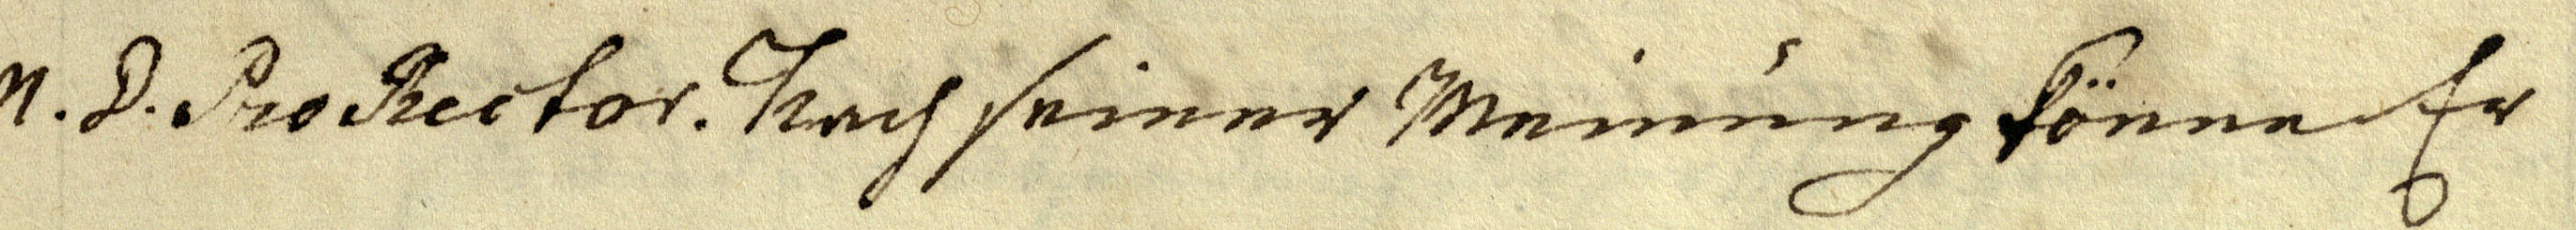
M. D. Rector. Nach seiner Meinung könne Er
